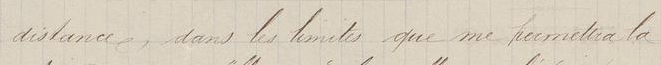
distance, dans les limites que me permettra la
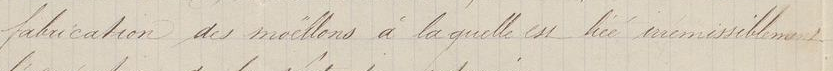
fabrication des moëllons à laquelle est liée inrémissiblement
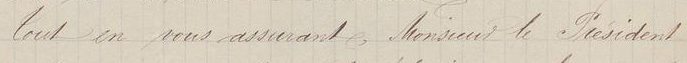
Tout en vous assurant, Monsieur le Président
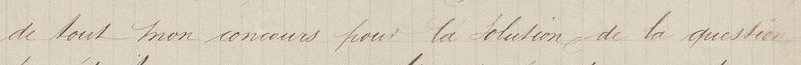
de tout mon concours pour la solution de la question
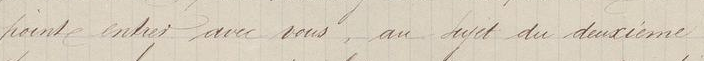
point entrer avec vous, au sujet du deuxieme
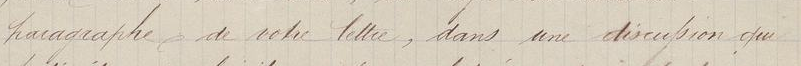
paragraphe de votre lettre, dans une discussion qui
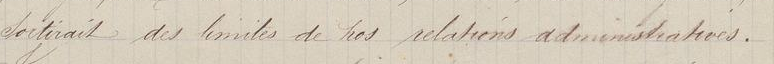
sortirait des limites de nos relations administratives.
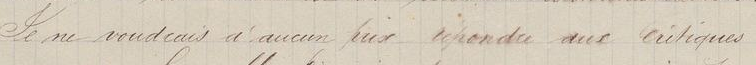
Je ne voudrais à aucun prix répondre aux critiques
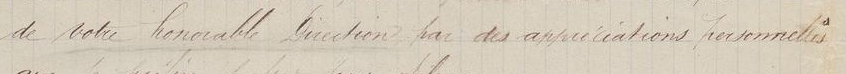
de votre honorable Direction par des appréciations personnelles
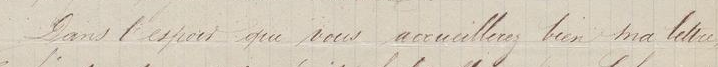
Dans l'espoir que vous accueillerez bien ma lettre,
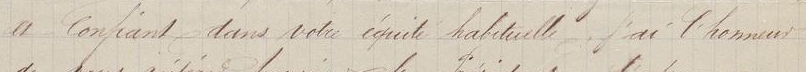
et confiant dans votre équité habituelle, j'ai l'honneur
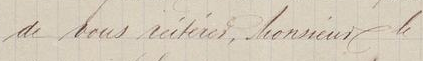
de vous réitérer, Monsieur le
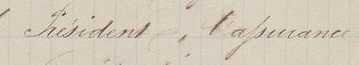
Président, l'assurance
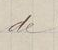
de
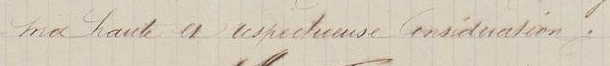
ma haute et respectueuse consideration.
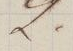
L.
